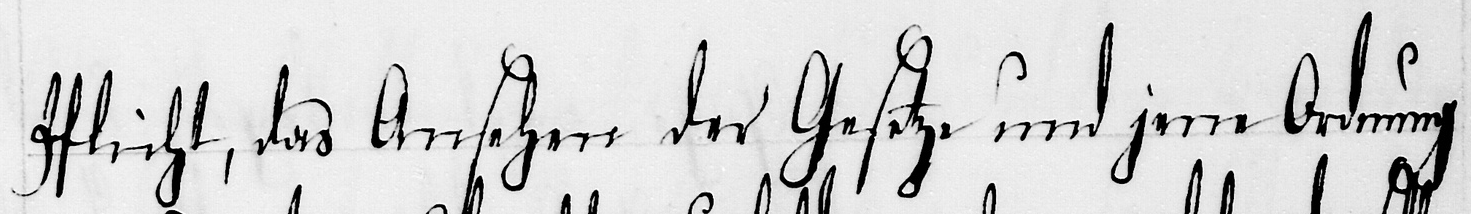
Pflicht, das Ansehen der Gesetze und jene Ordnung
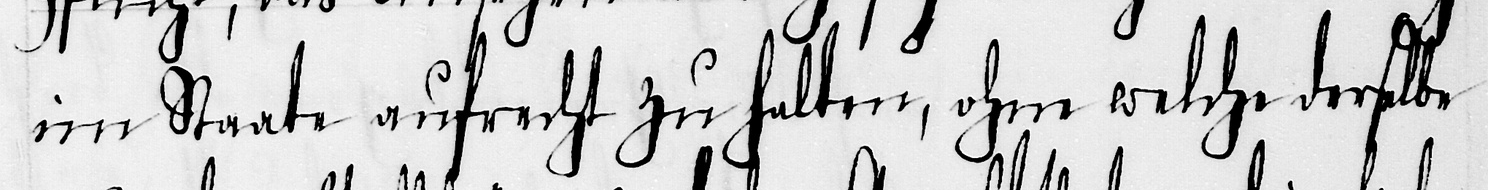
im Staate aufrecht zu halten, ohne welche derselbe
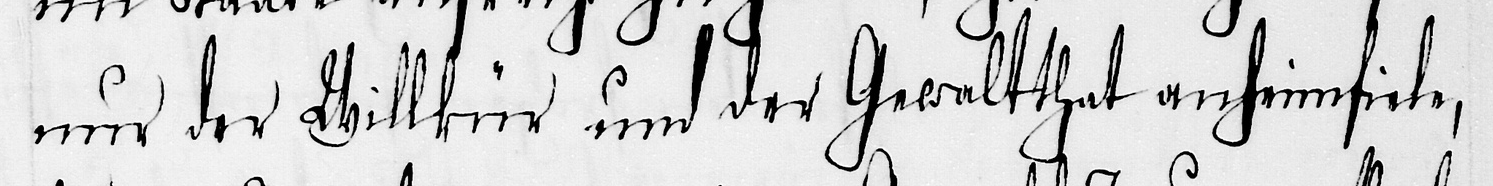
nur der Willkür und der Gewaltthat anheimfiele,
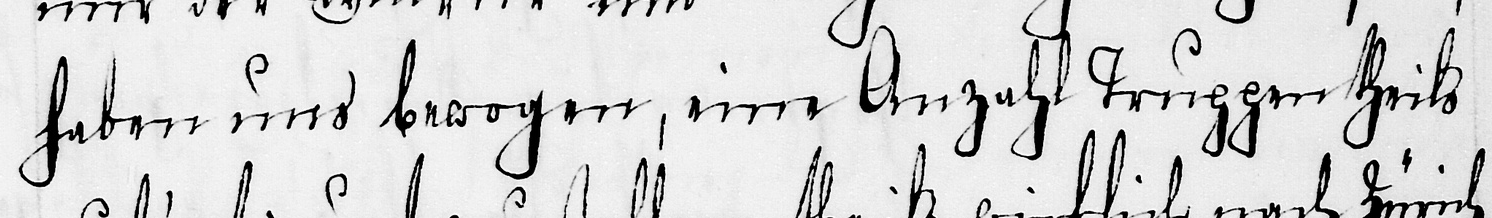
haben uns bewogen, eine Anzahl Truppen theils
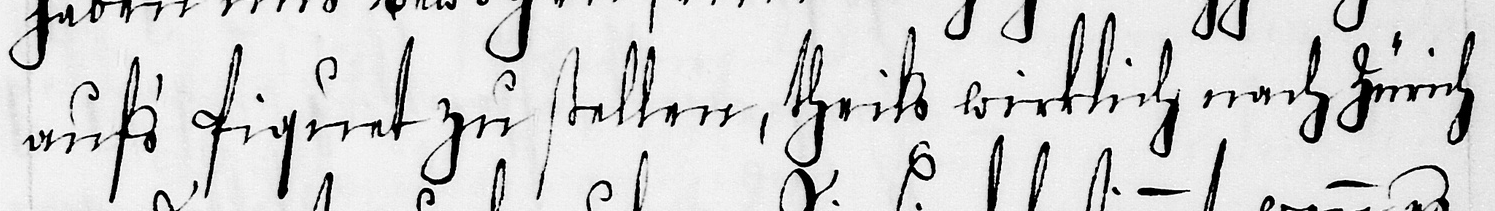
auf’s Piquet zu stellen, theils wirklich nach Zürich
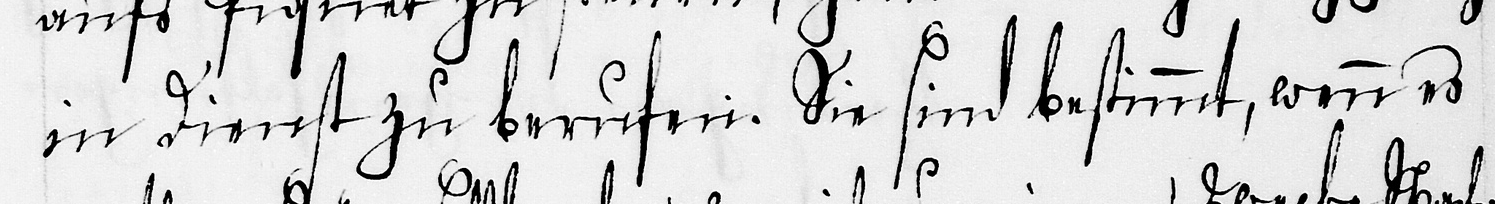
in Dienst zu berufen. Sie sind bestimmt, wenn es
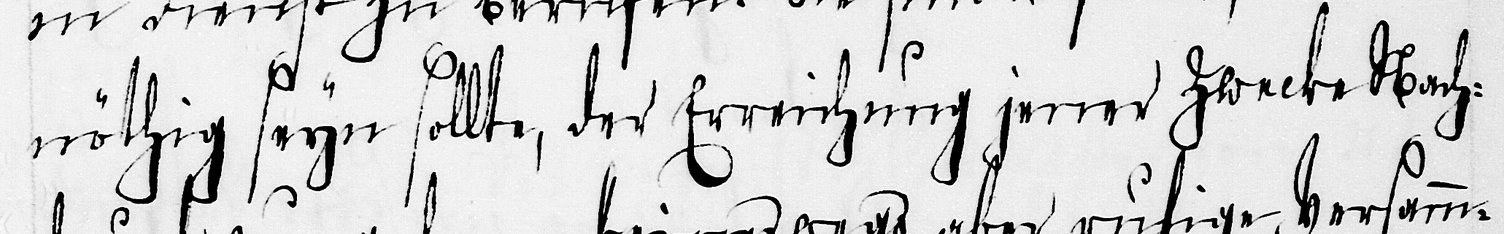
nöthig seyn sollte, der Erreichung jener Zwecke Nach¬
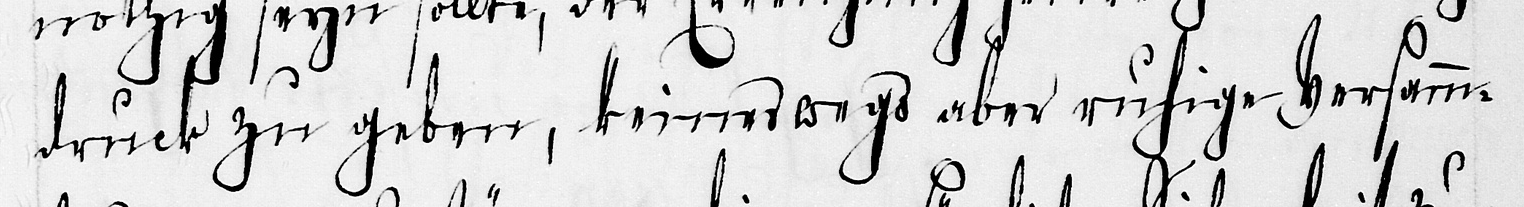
druck zu geben, keineswegs aber ruhige Versamm¬
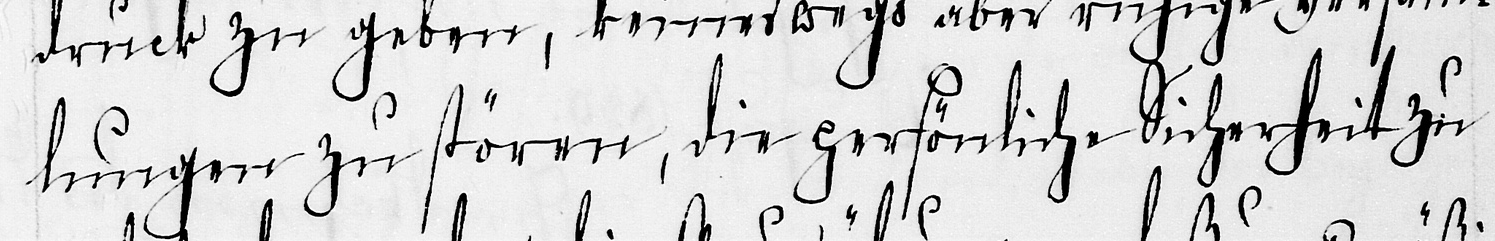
lungen zu stören, die persönliche Sicherheit zu
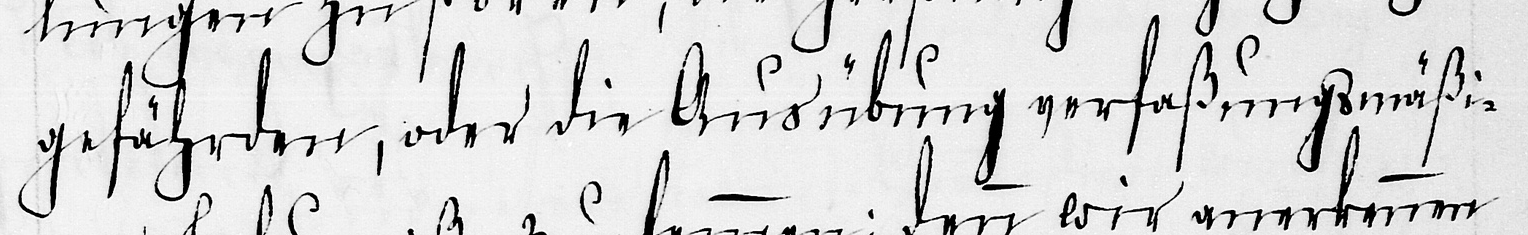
gefährden, oder die Ausübung verfaßungsmäßi¬
